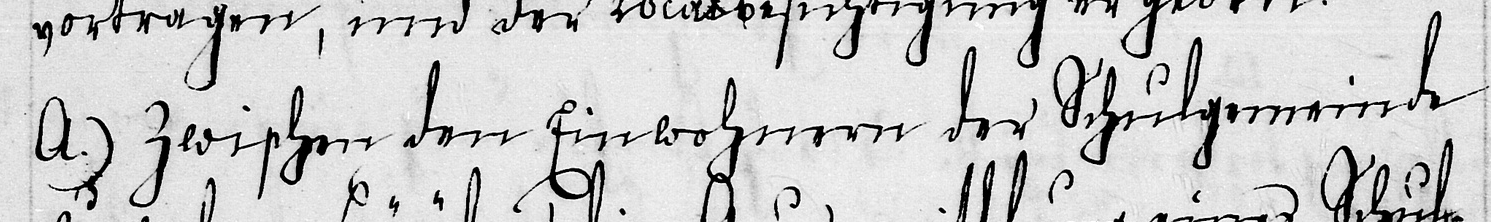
A.) Zwischen den Einwohnern der Schulgemeinde
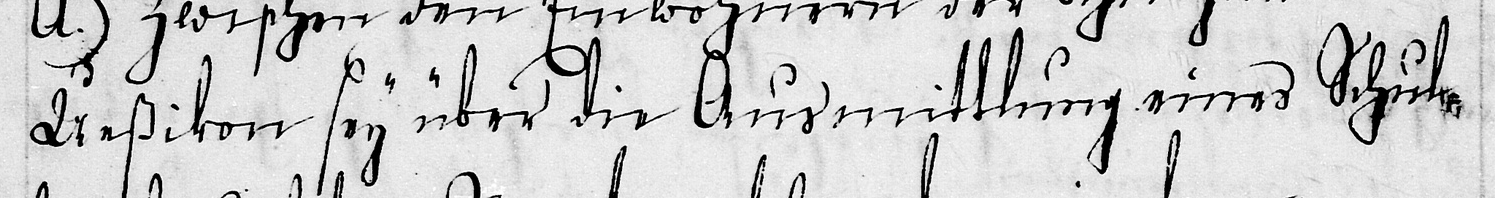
Ueßikon sey über die Ausmittlung eines Schul¬
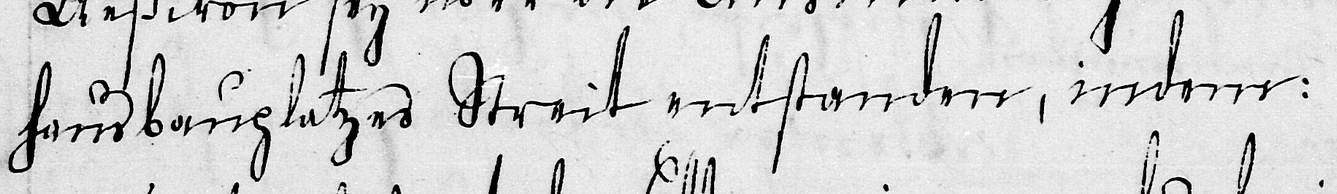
hausbauplatzes Streit entstanden, indem:
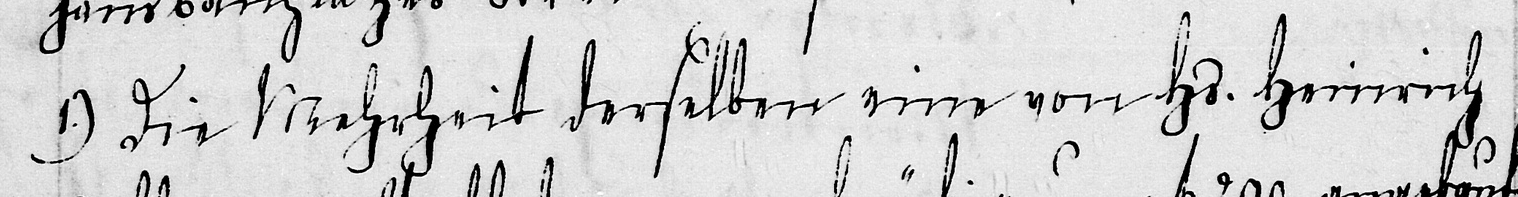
1.) Die Mehrheit derselben eine von Hs. Heinrich
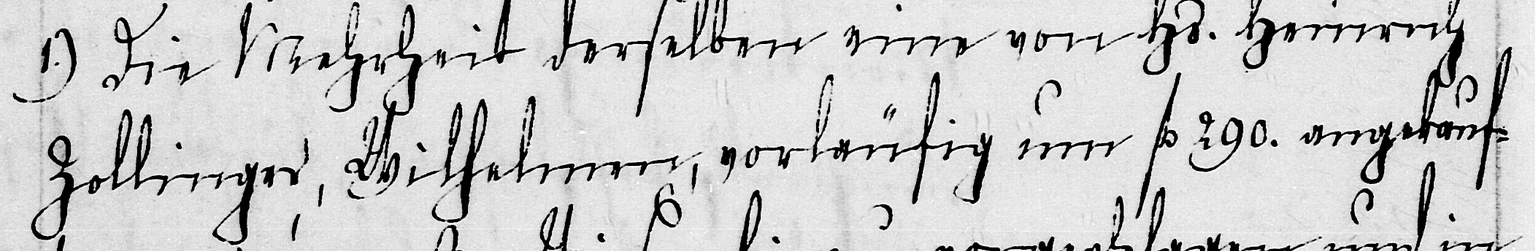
Zollinger, Wilhelmen, vorläufig um fl. 290. angekauft¬
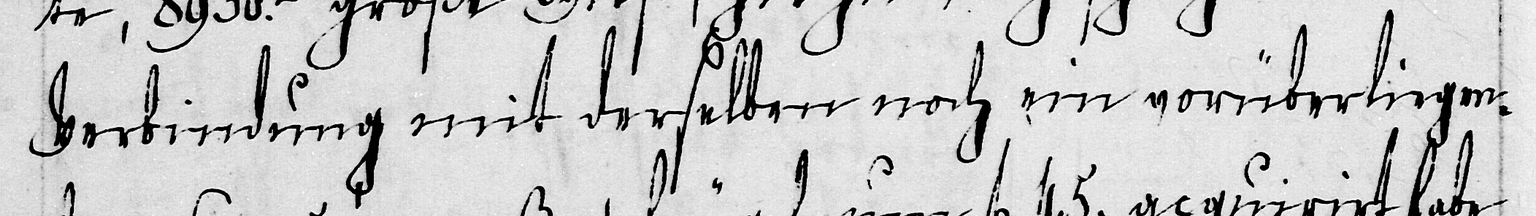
Verbindung mit derselben noch ein vorüberliegen¬
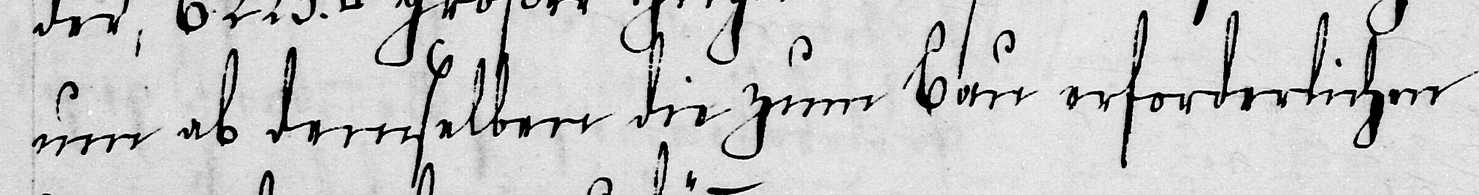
um ab demselben die zum Bau erforderlichen
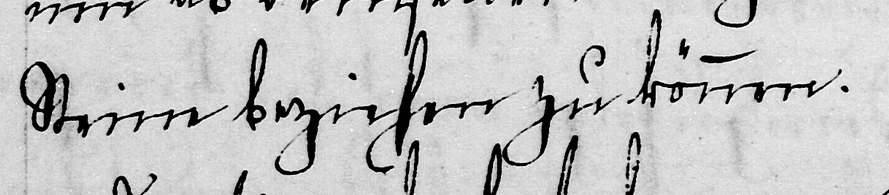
Steine beziehen zu können.
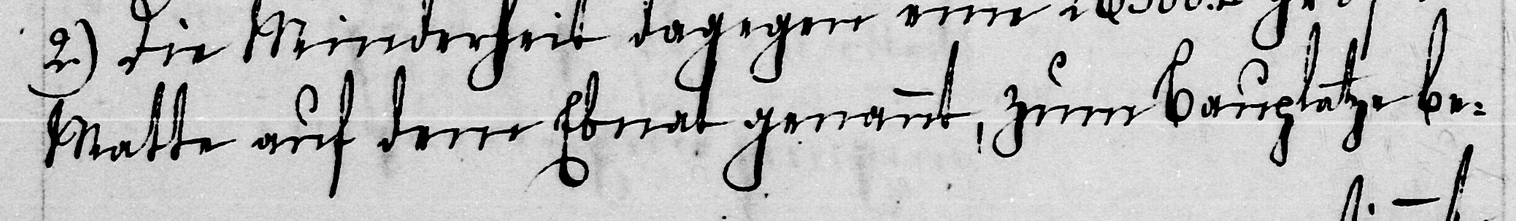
Matte auf dem Ebnat genannt, zum Bauplatze be-
